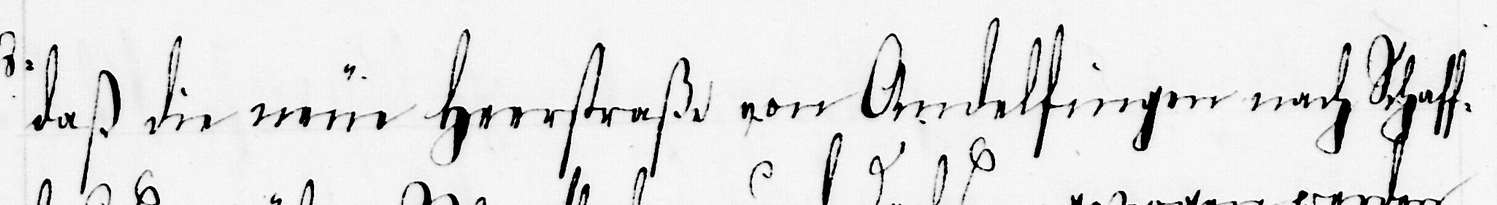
daß die neue Heerstraße von Andelfingen nach Schaf¬
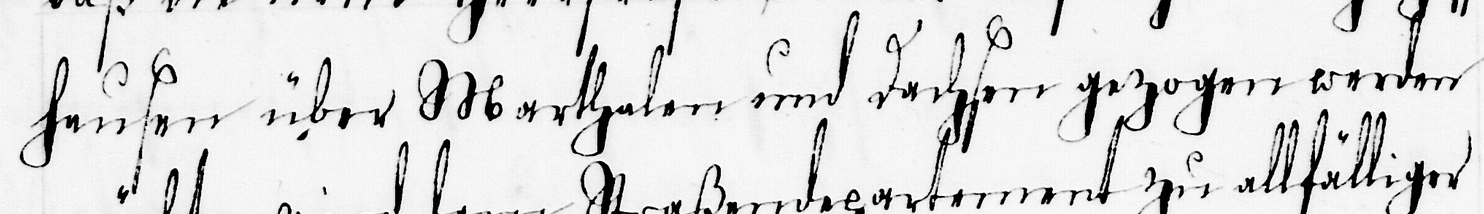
fhausen über Marthalen und Dachsen gezogen werden
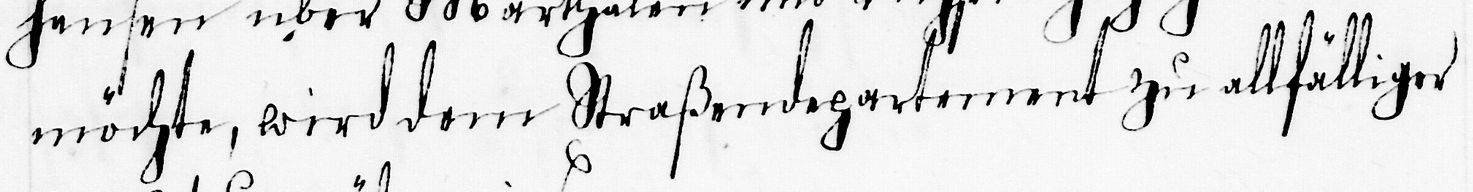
möchte, wird dem Straßendepartement zu allfälliger
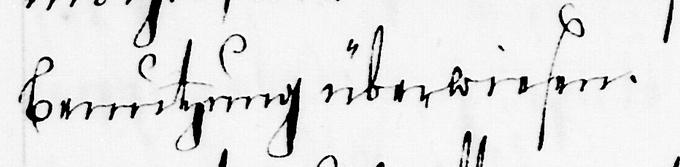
Benutzung überwiesen.
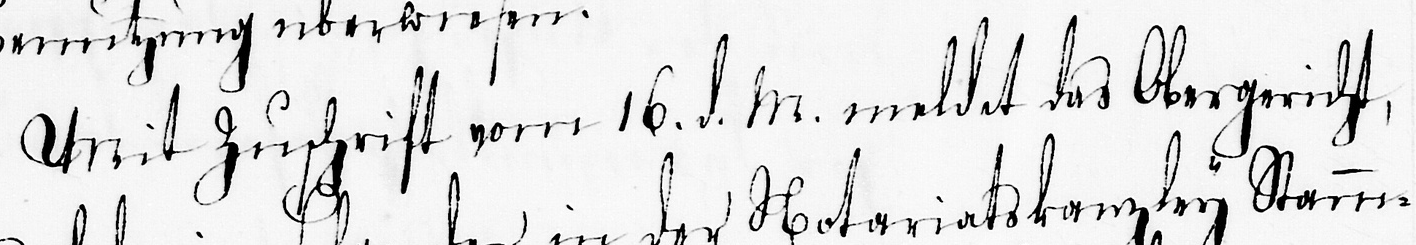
Mit Zuschrift vom 16. d. M. meldet das Obergericht,
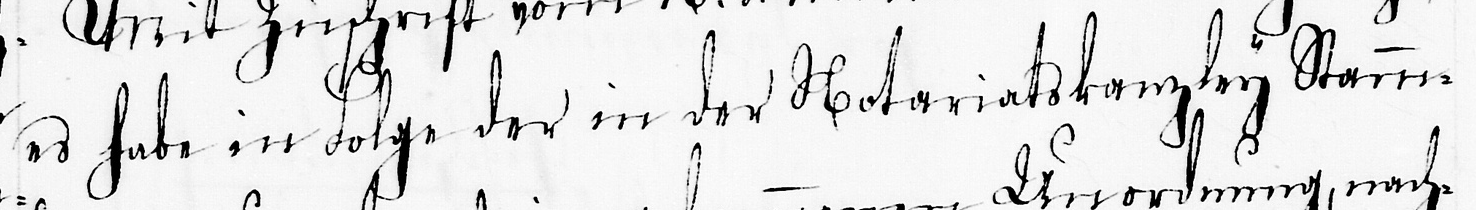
es habe in Folge der in der Notariatskanzley Stamm¬
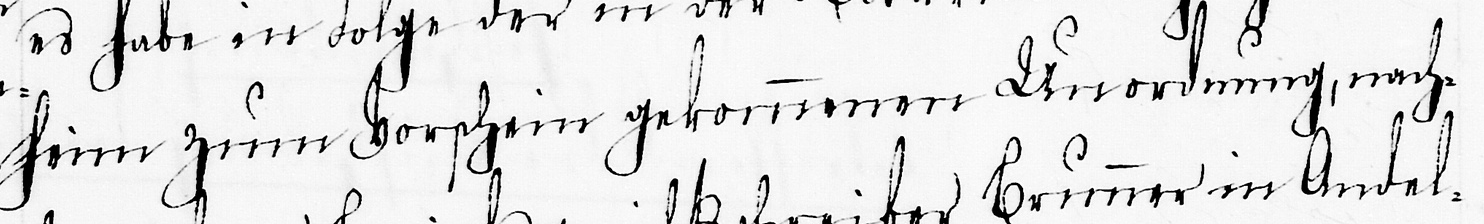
heim zum Vorschein gekommenen Unordnung, nach¬
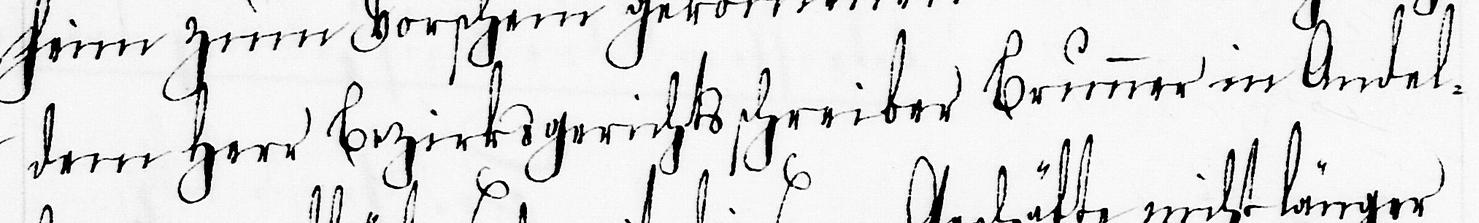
dem Herr Bezirksgerichtsschreiber Brunner in Andel¬
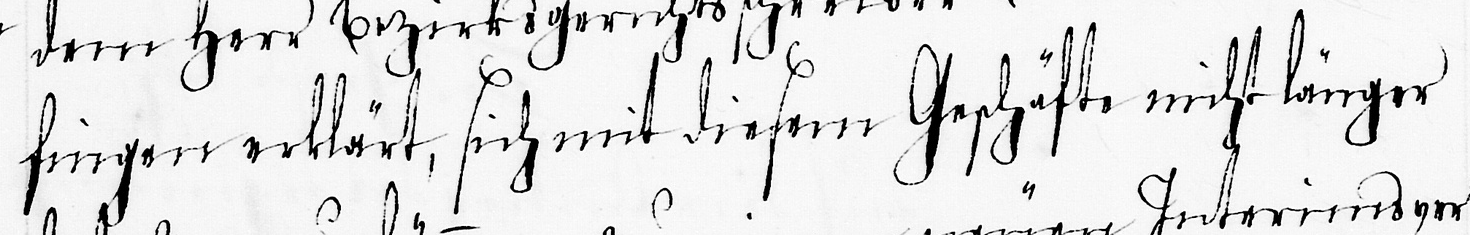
fingen erklärt, sich mit diesem Geschäfte nicht länger
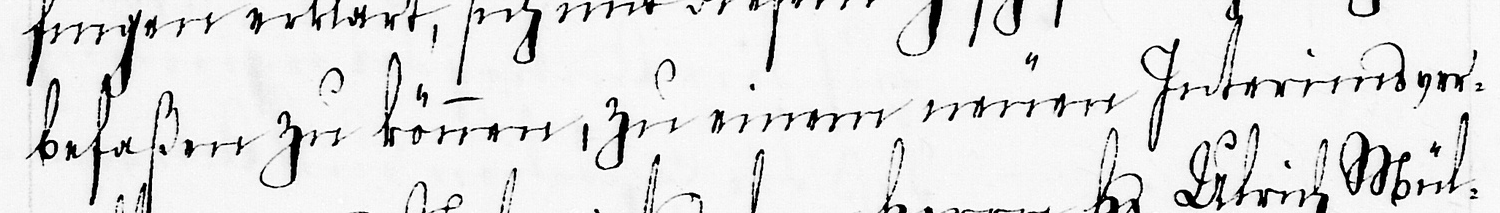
befaßen zu können, zu einem neuen Interimsver¬
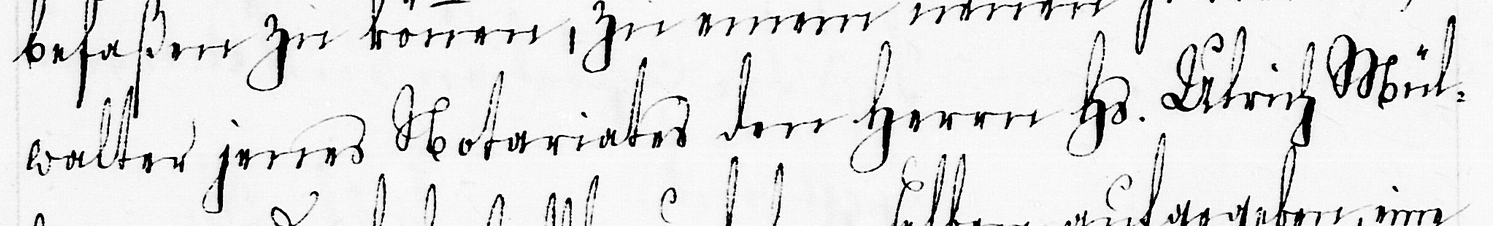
walter jenes Notariates den Herrn Hs. Ulrich Mül¬
